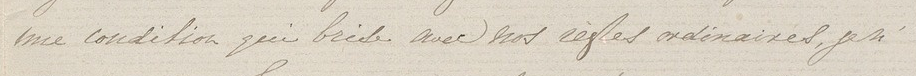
une condition qui brise avec nos règles ordinaires, je n'
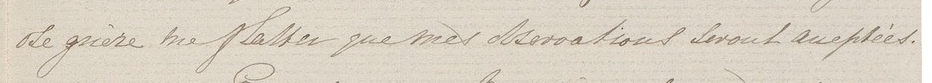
ose guère me flatter que mes observations seront acceptées.
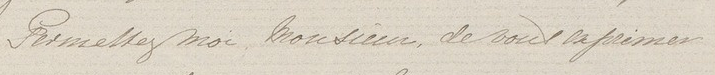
Permettez-moi, Monsieur, de vous exprimer
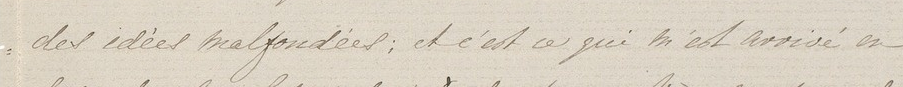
des idées malfondées; et c'est ce qui m'est arrivé en
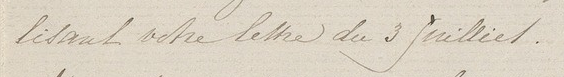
lisant votre lettre du 3 Juilliet.
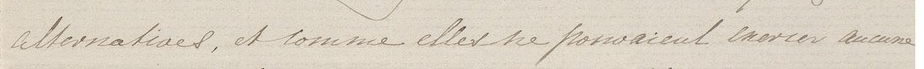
alternatives, et comme elles ne pouvaient exercer aucune
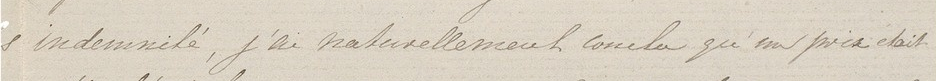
indemnité, j'ai naturellement conclu qu'un prix était
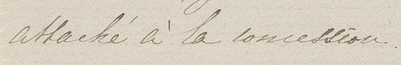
attaché à la concession.
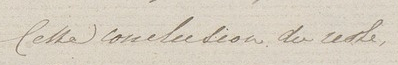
Cette conclusion du reste,
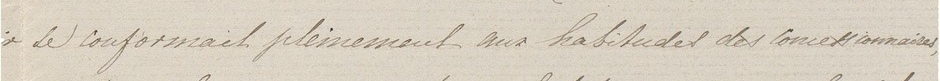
se conformait pleinement aux habitudes des concessionnaires,
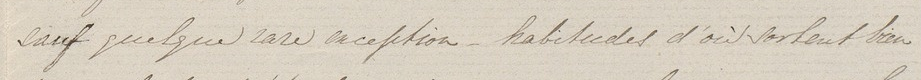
sauf quelque rare exception– habitudes d'où sortent bien
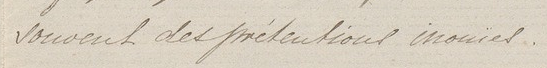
souvent des prétentions inouïes.
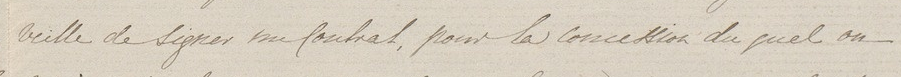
veille de signer un contrat, pour la concession du quel on
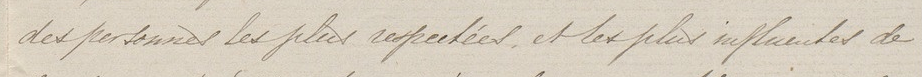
des personnes les plus respectées, et les plus influentes de
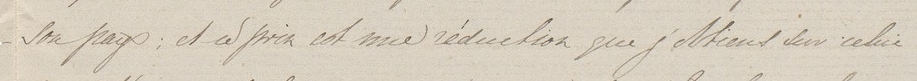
son pays; et ce prix est une réduction que j'obtiens sur celui
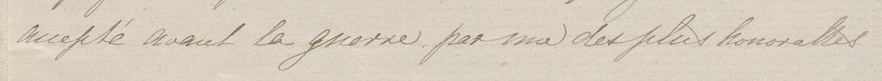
accepté avant la guerre par une des plus honorables
